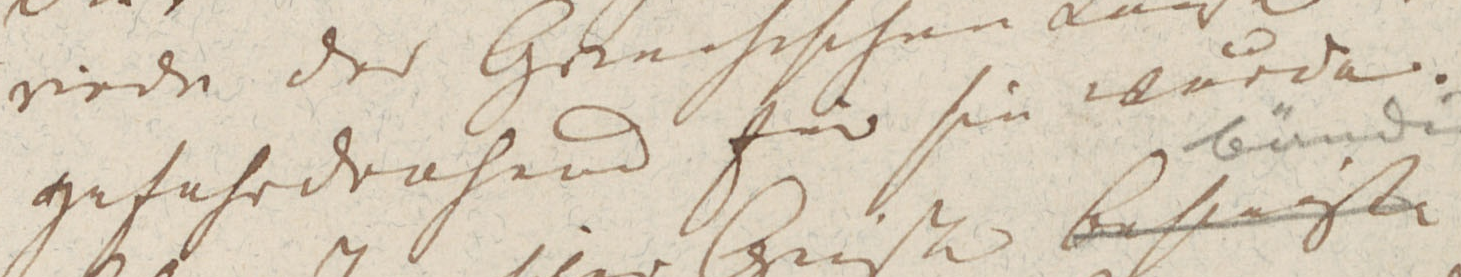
gefahrdrohend für sie wurde.
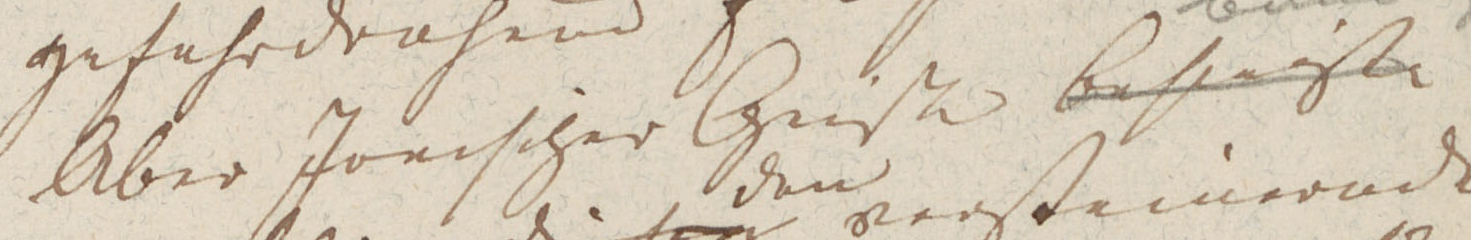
Aber Ionischer Geist besiegte
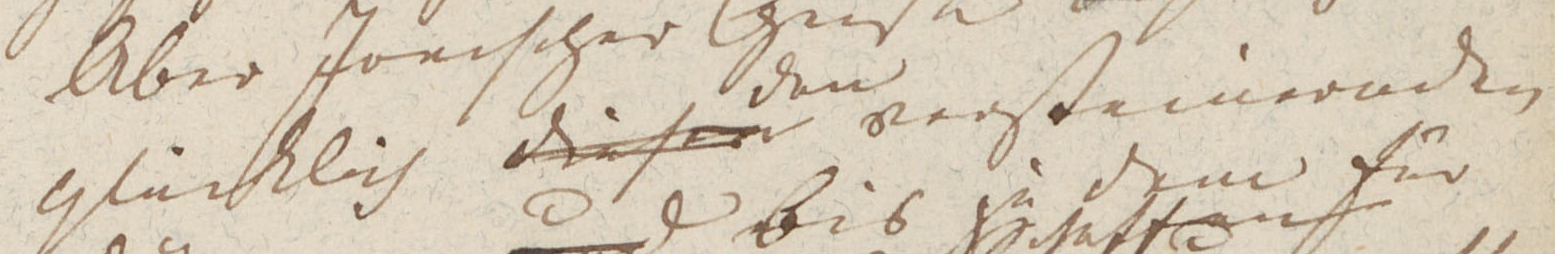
glücklich diesen den versteinernden
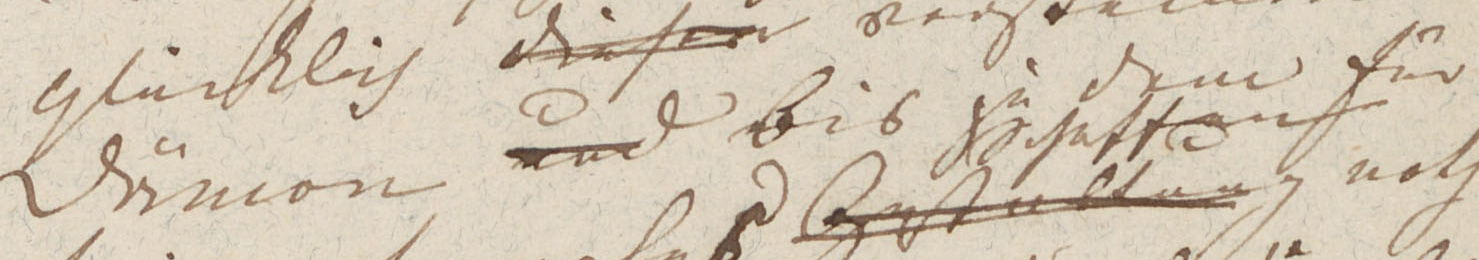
Dämon und bis zu dem für
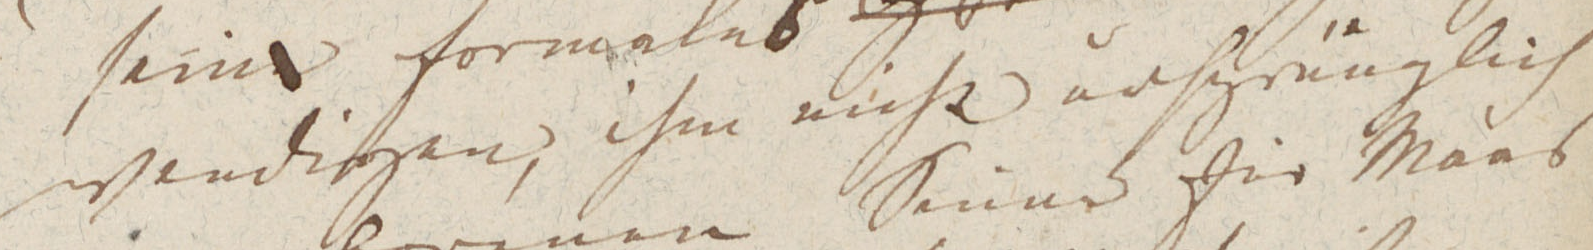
wendigen, ihm nicht ursprünglich
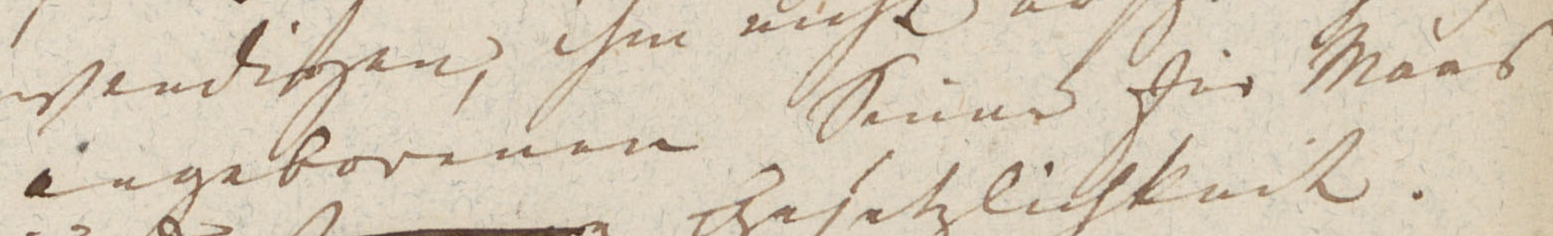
angeborenen Sinne für Maas
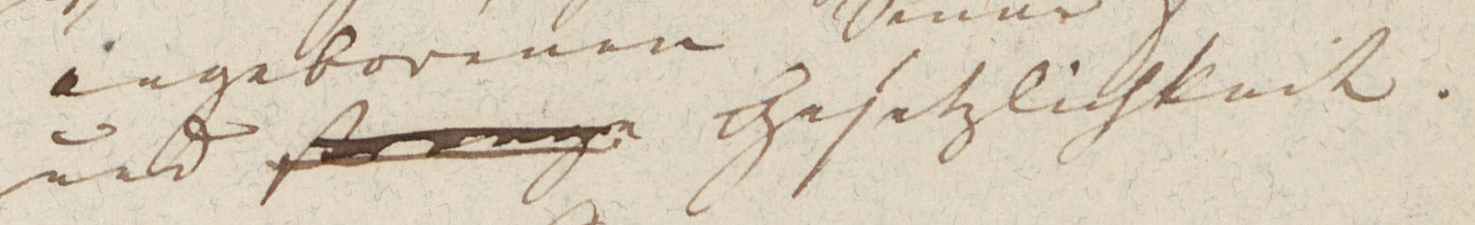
und strenge Gesetzlichkeit.
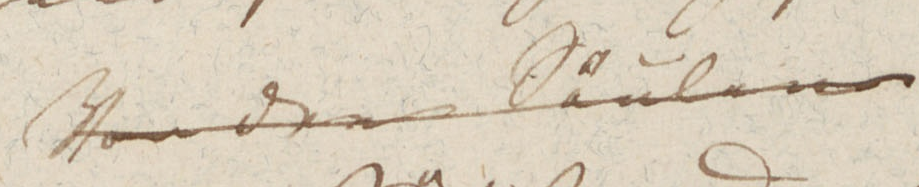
Von den Säulen
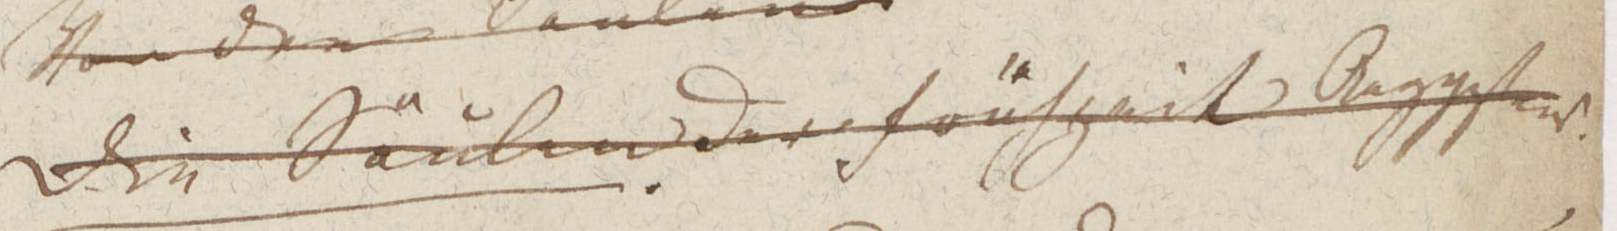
Die Säulen der Frühzeit Aegyptens.
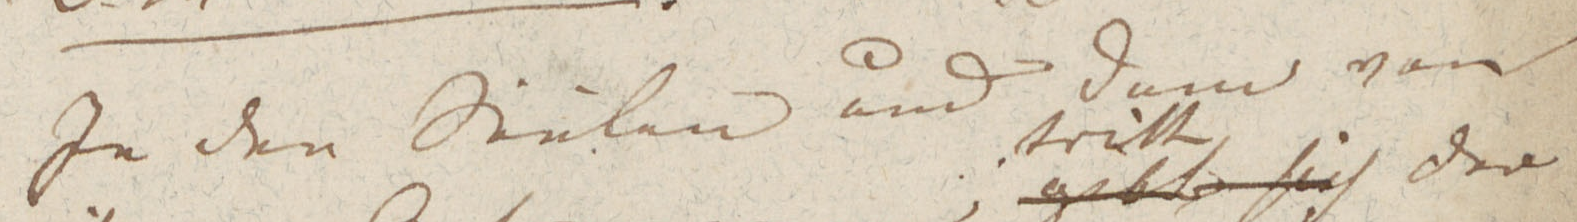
In den Säulen und dem von
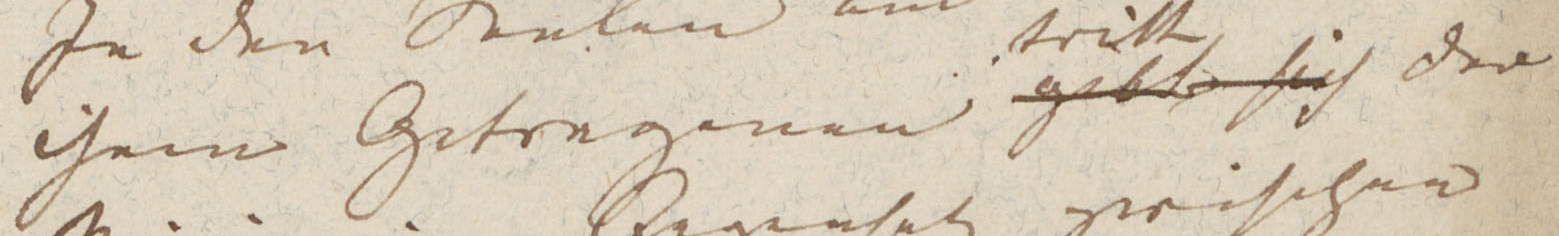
ihnen Getragenen gibt tritt sich der
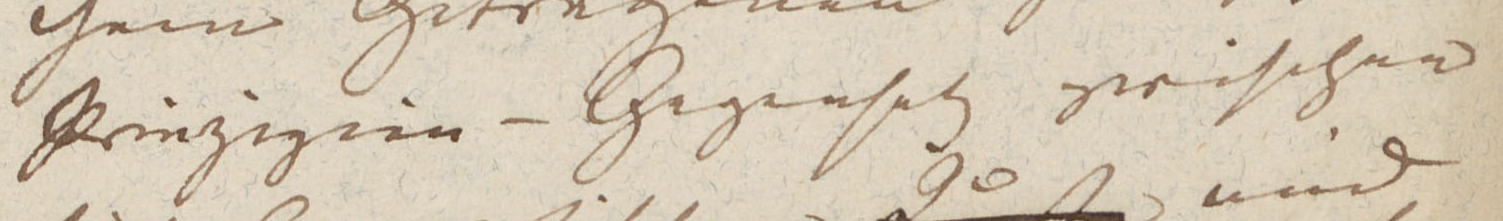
Prinzipien-Gegensatz zwischen
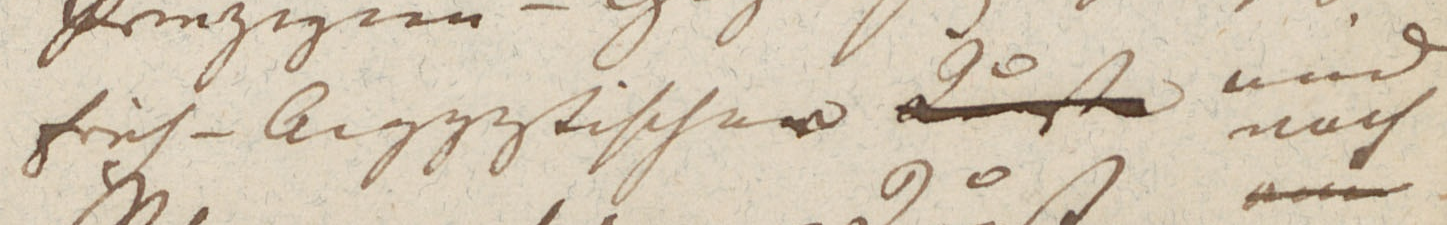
Früh-Aegyptischer Kunst und
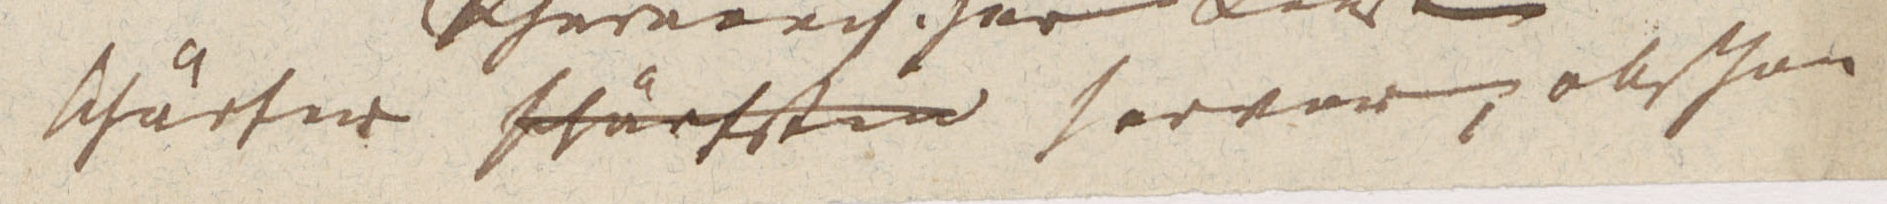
schärfer schärfsten hervor, obschon
